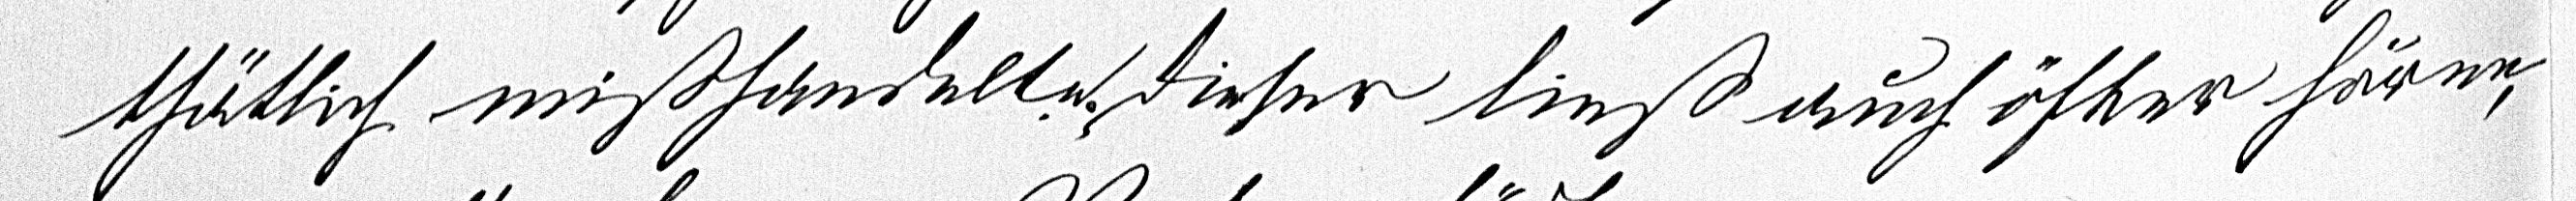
thätlich mißhandelte. dieser ließ auch öfter huren,
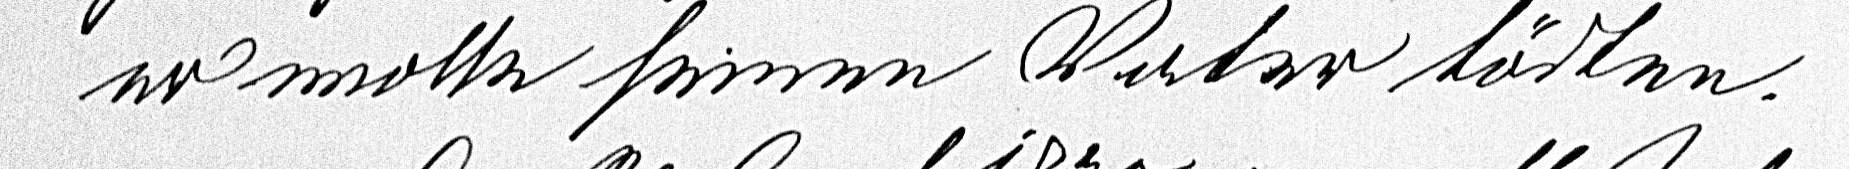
er wolle seinen Vater tödten.
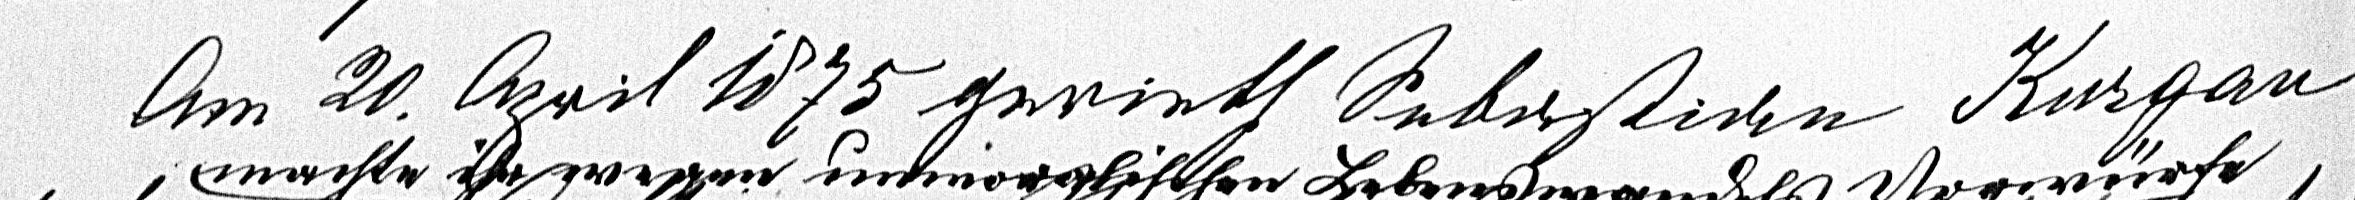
Am 20. April 1875 gerieth Sebastian Kurgan
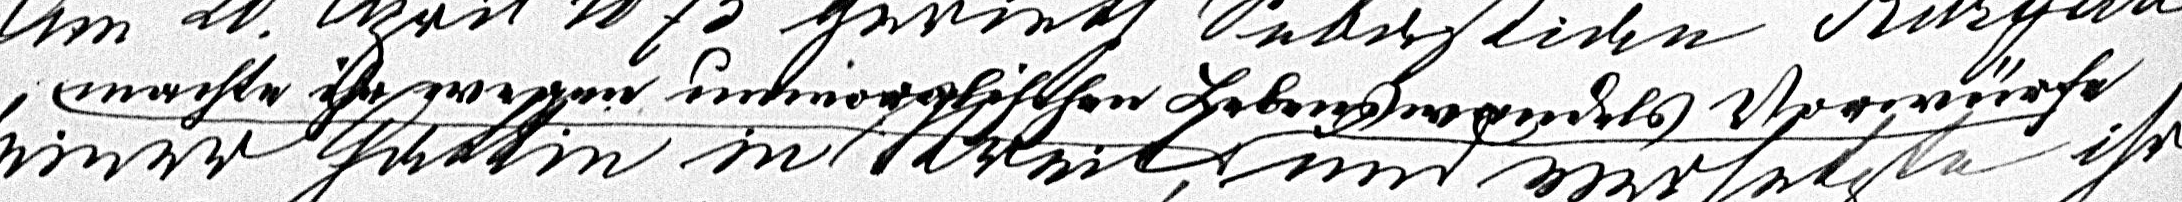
machte ihr wegen unmoralischen Lebenswandels Vorwürfe
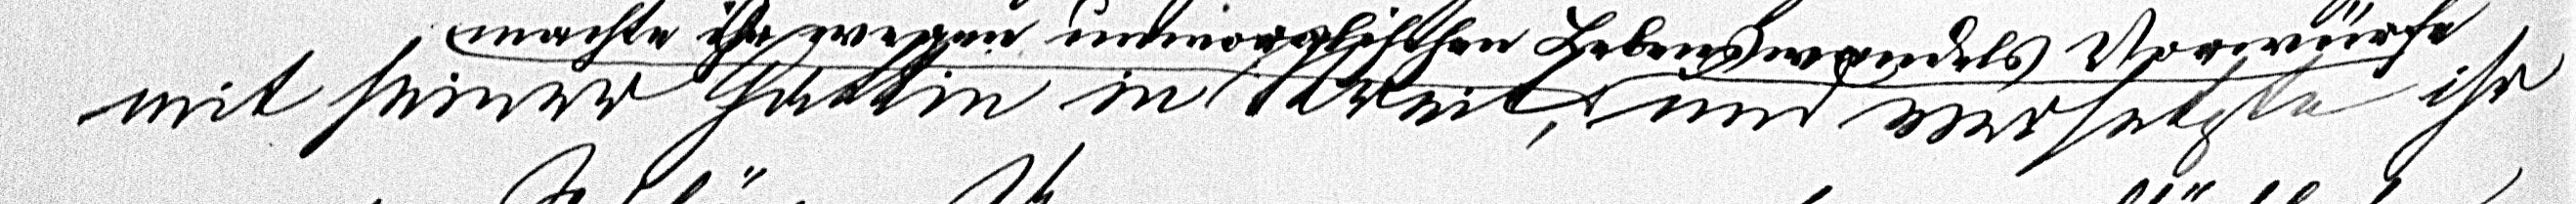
mit seiner Gattin in Streit, und versetzte ihr
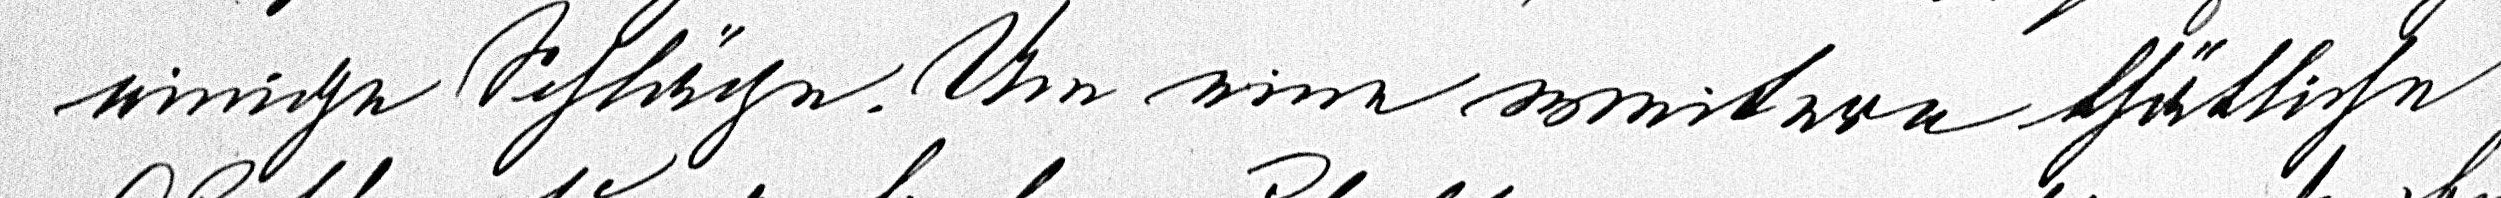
einige Schläge. Am eine weitere thätliche
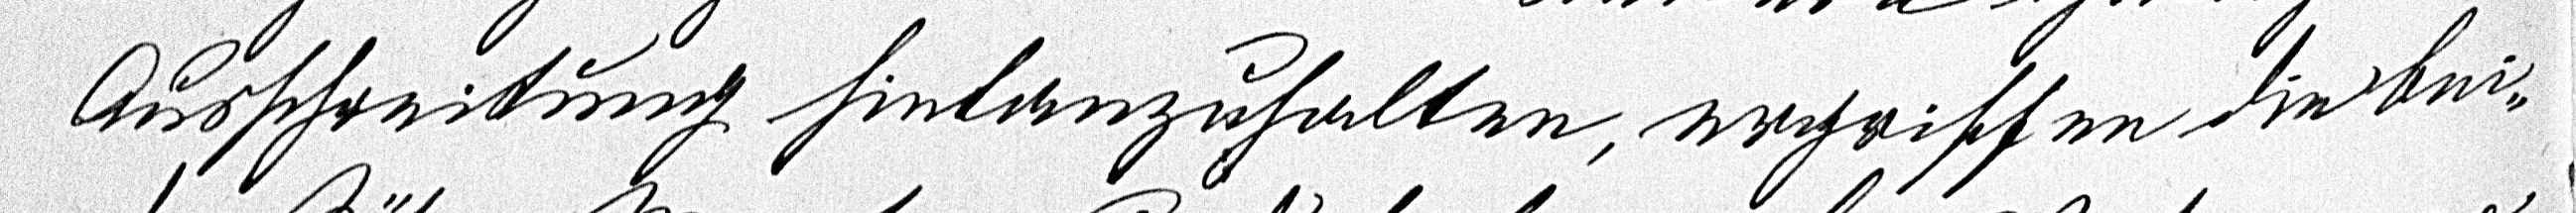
Ausschreitung hintanzuhalten, ergriffen die bei¬
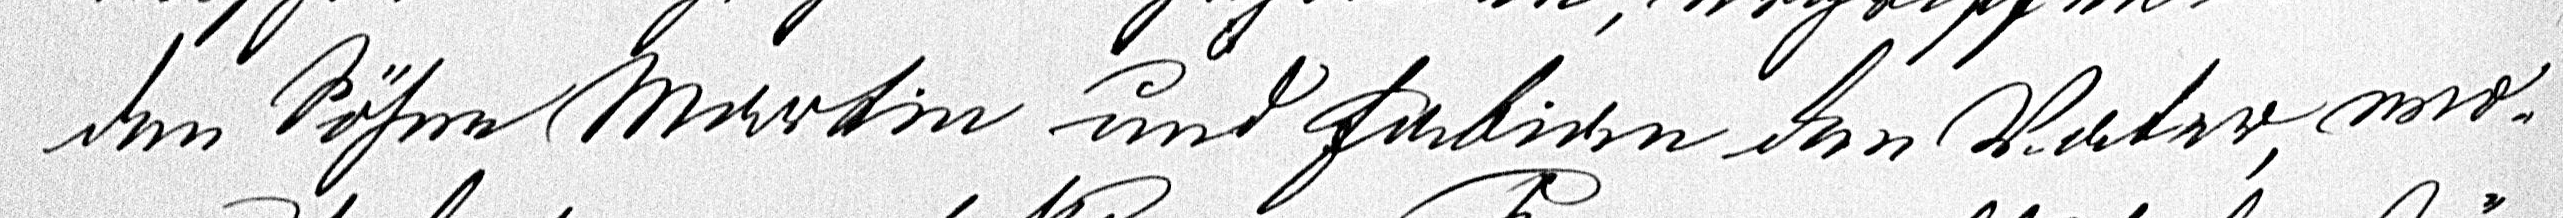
den Söhne Martin und Fabian den Vater, wo¬
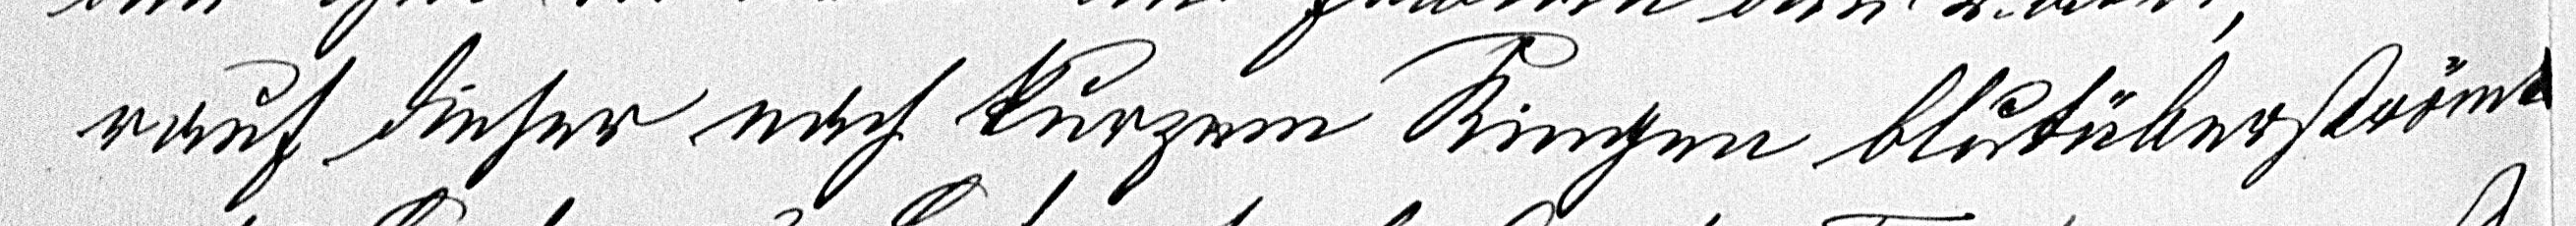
rauf dieser nach kurzem Kingen blutüberströmxx
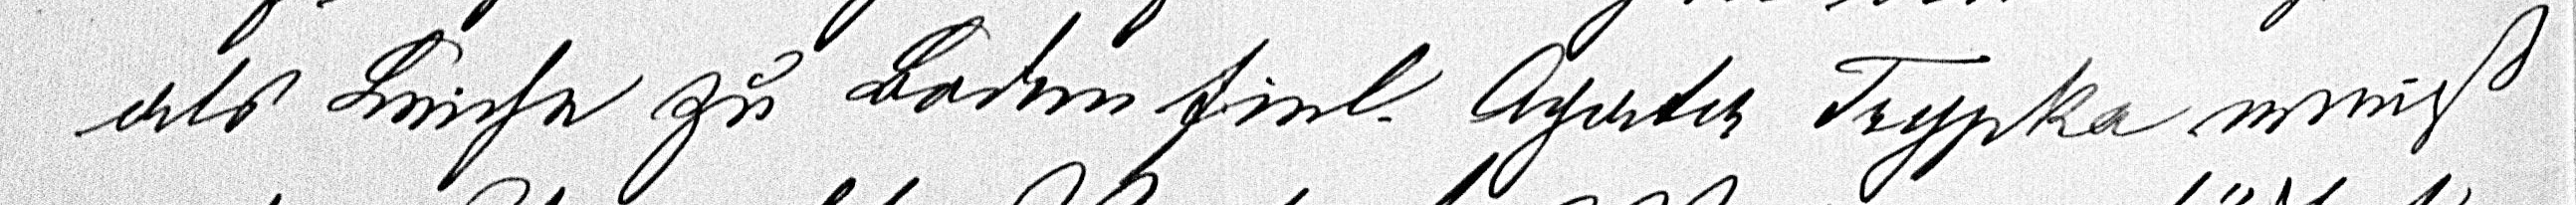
als Leiche zu Boden fiel. Agata Trzpka weiß
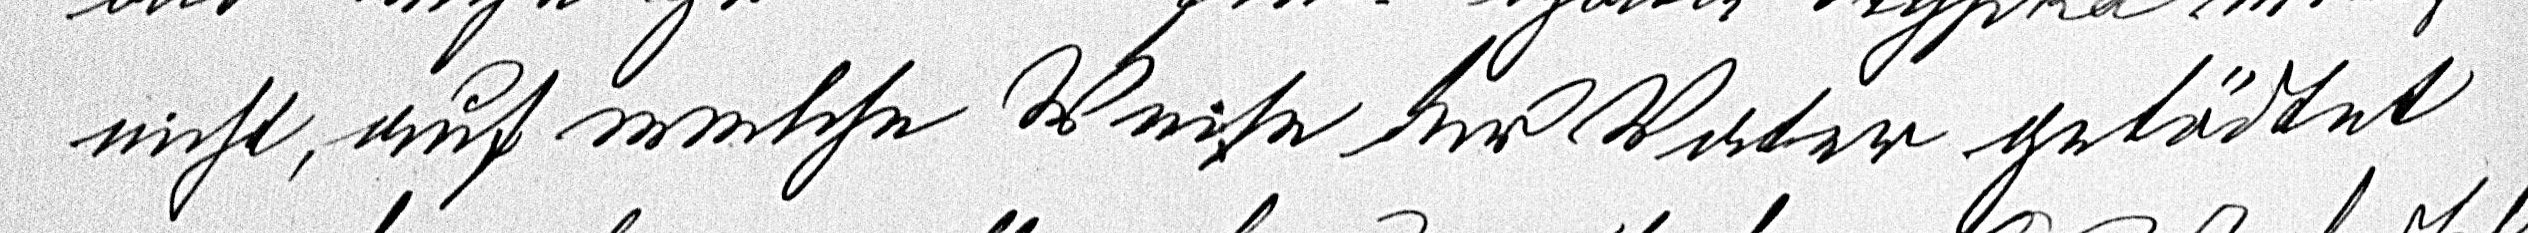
nicht, auf welche Wxx der Vater getödtet
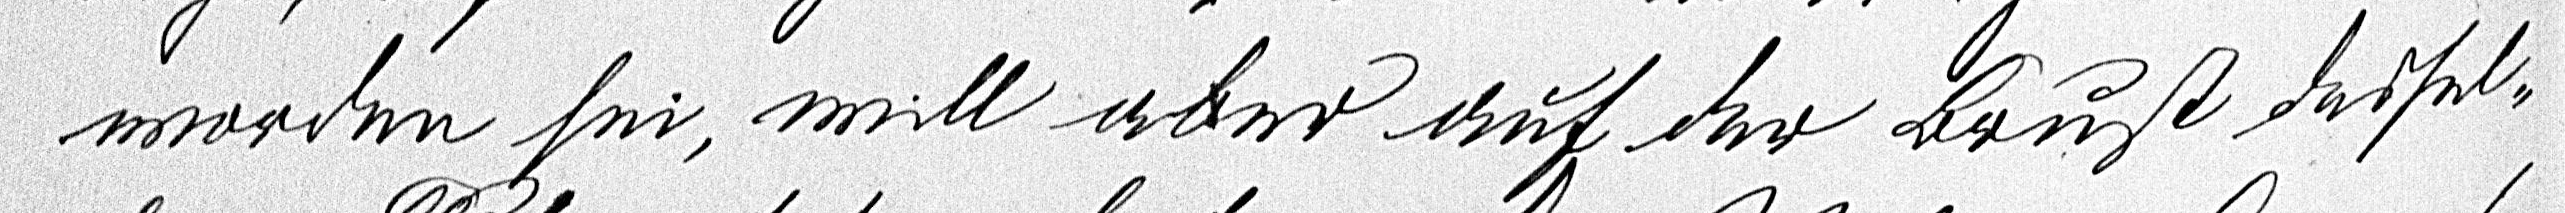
morden sei, will aber auf der Brust dersel¬
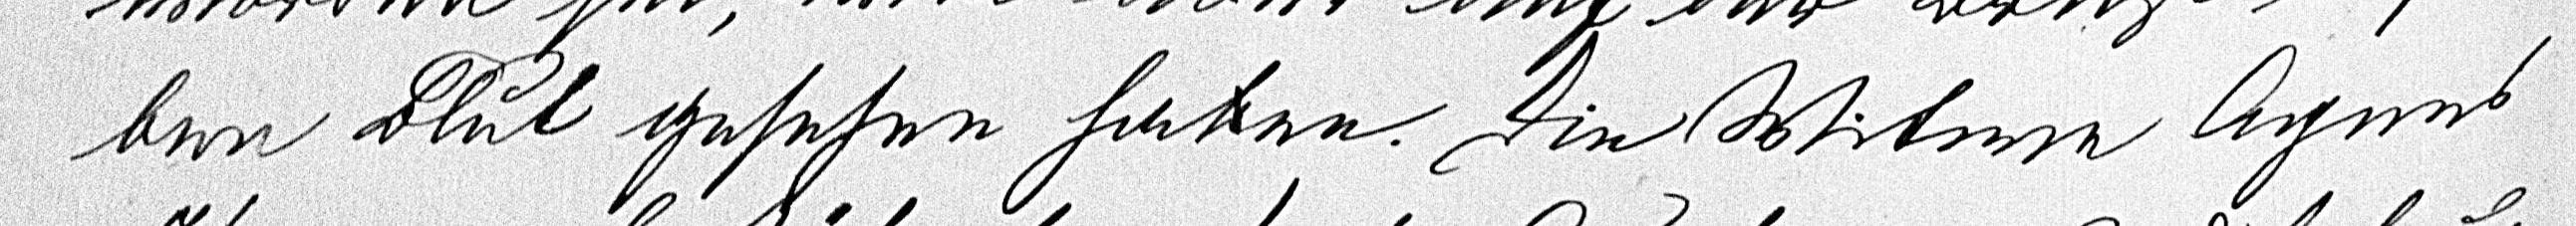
ben Blut gesehen haben. Die Witwe Agnes
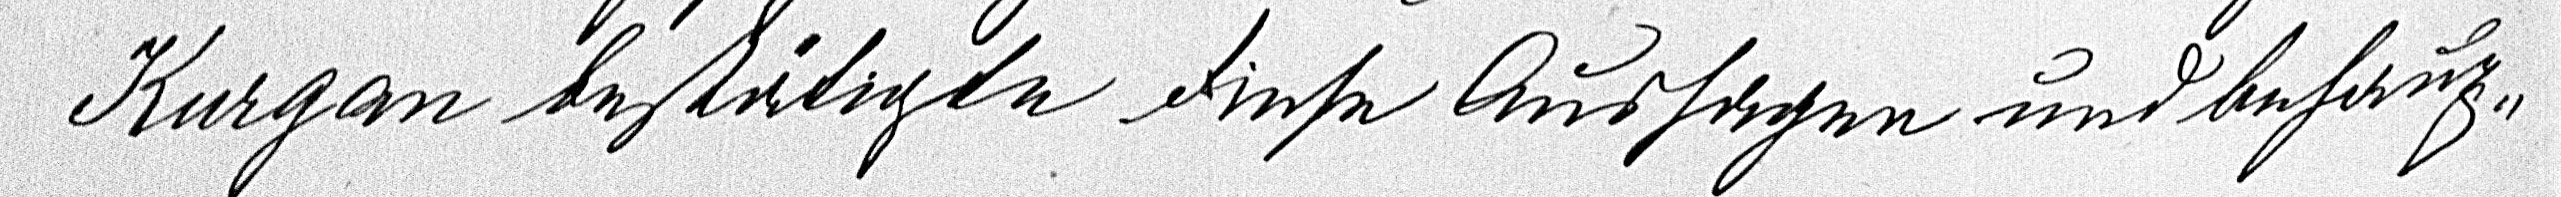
Kurgan bestätigte diese Aussagen und behaup¬
